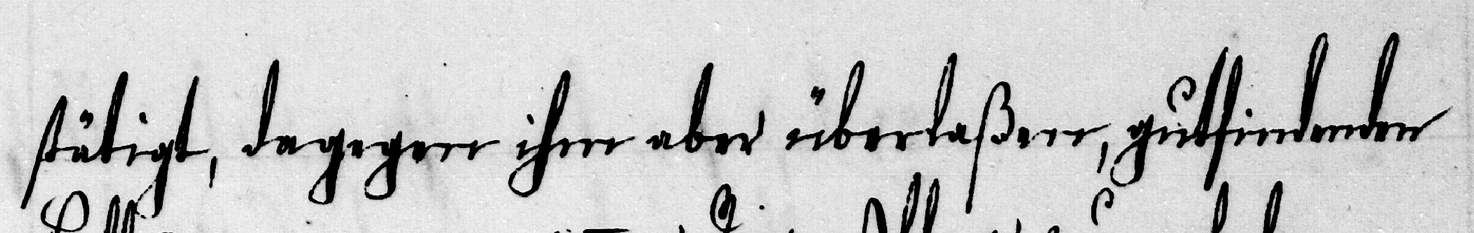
stätigt, dagegen ihm aber überlaßen, gutfindenden
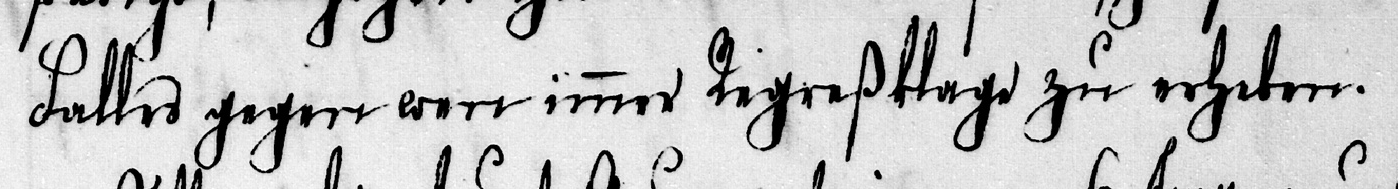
Falles gegen wen immer Regreßklage zu erheben.
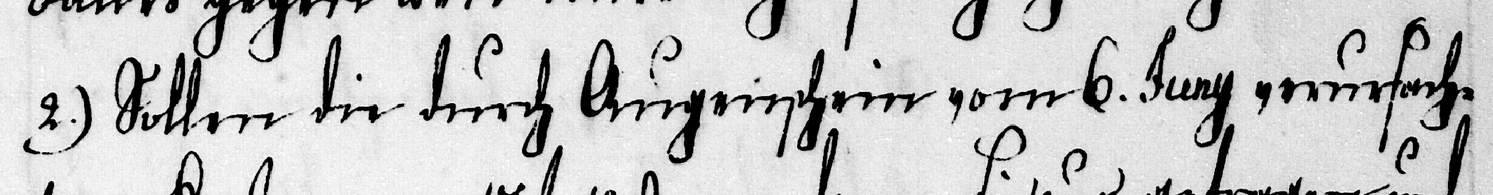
2.) Sollen die durch Augenschein vom 6. Juny verursach¬
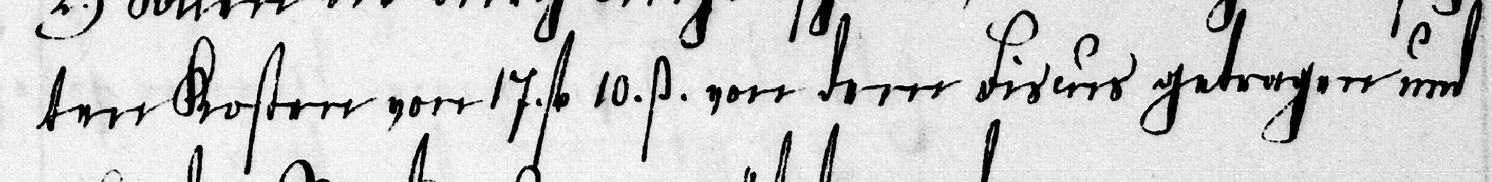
ten Kosten von 17. fl 10. ß. von dem Fiscus getragen und
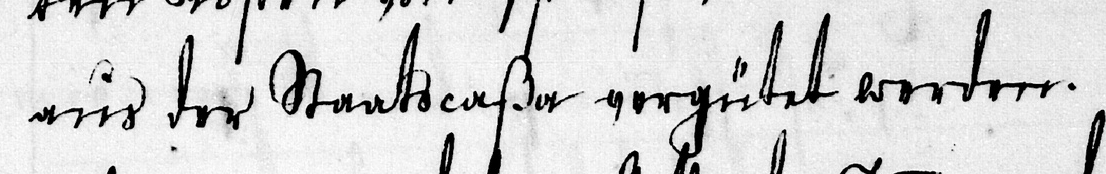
aus der Staatscaßa vergütet werden.
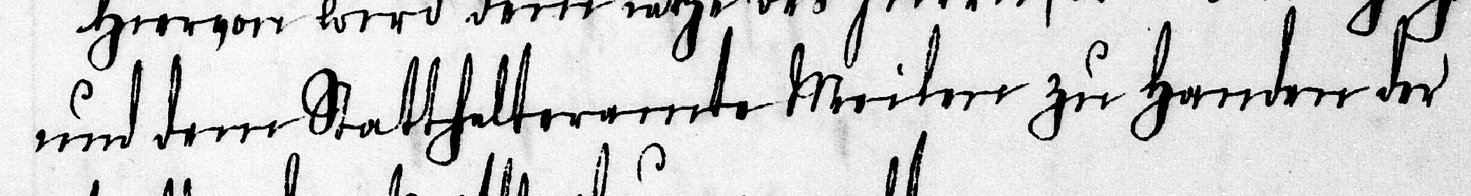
und dem Statthalteramte Meilen zu Handen der
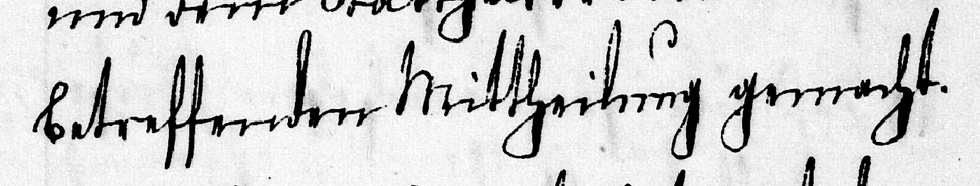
Betreffenden Mittheilung gemacht.
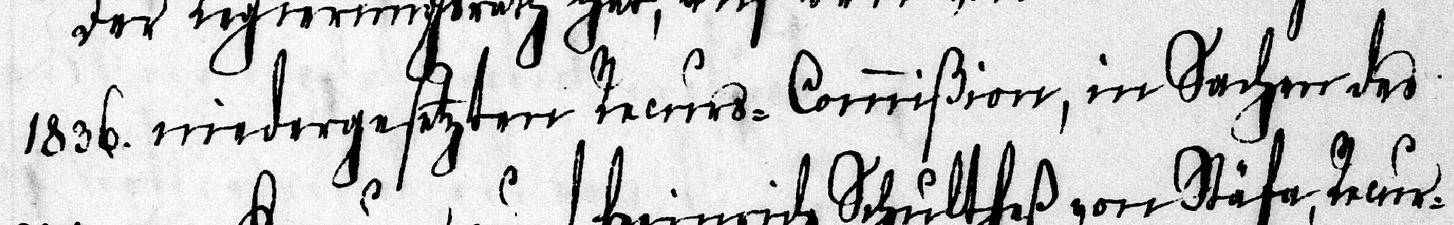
1836. niedergesetzten Recurs-Commißion, in Sachen des
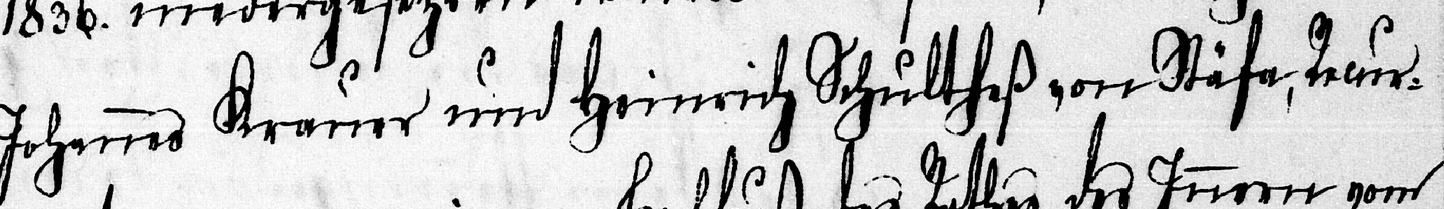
Johannes Krauer und Heinrich Schultheß von Stäfa, Recur¬
